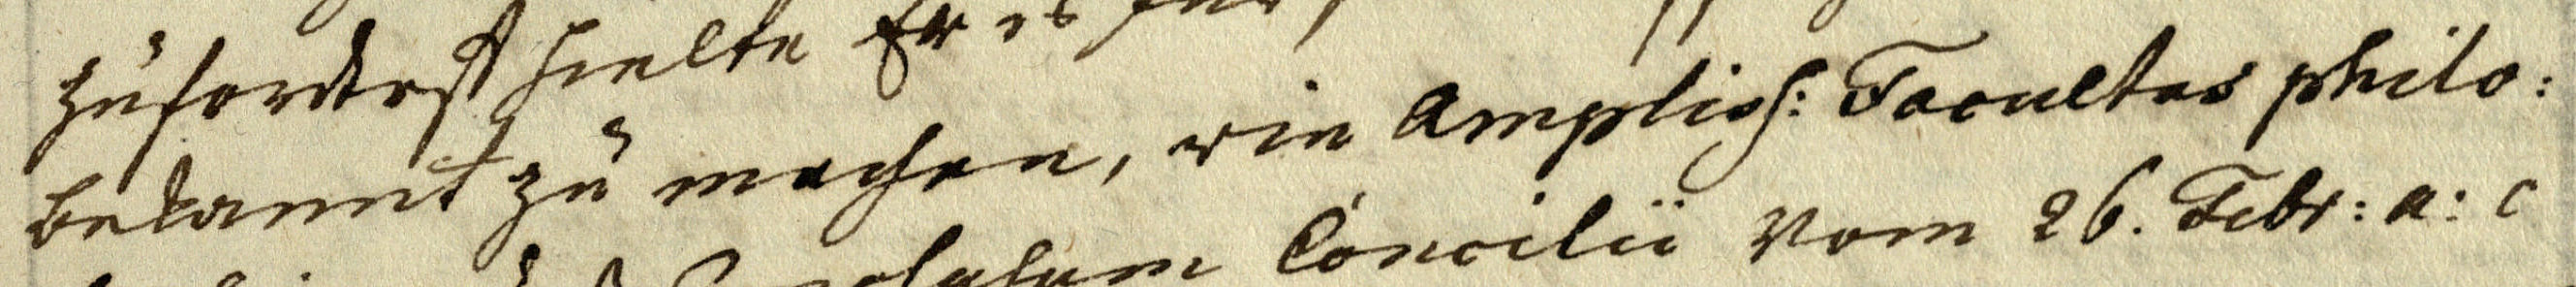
bekannt zu machen, wie Ampliss. Facultas philo¬
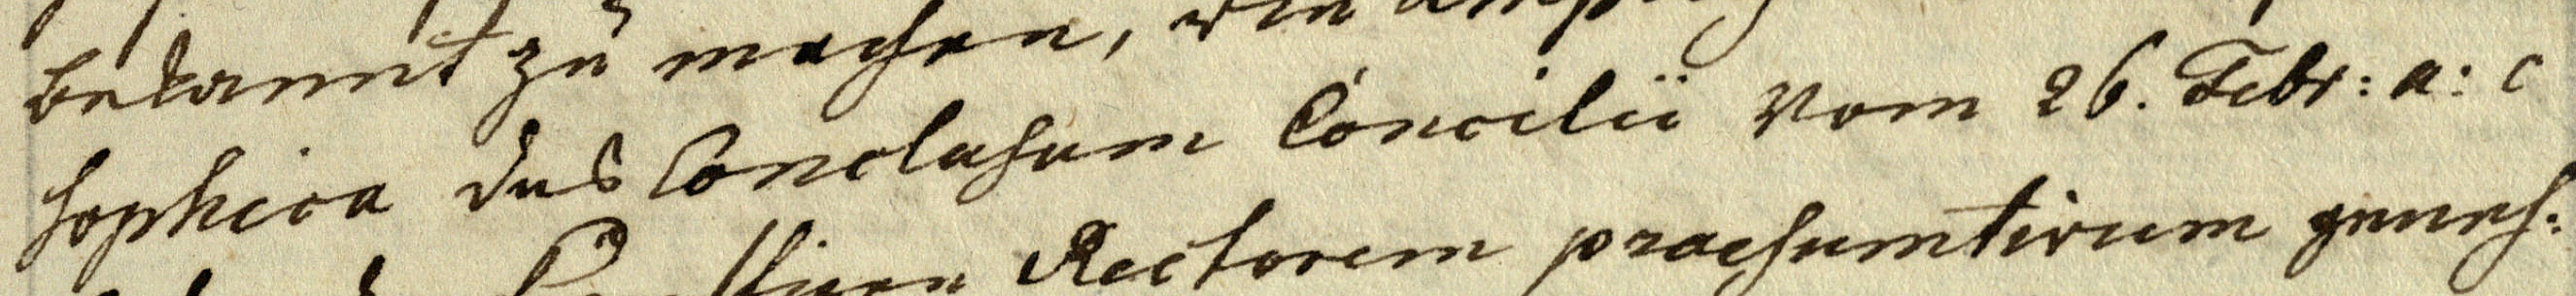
sophica das Conclusum Concilii vom 26. Febr. a. c.
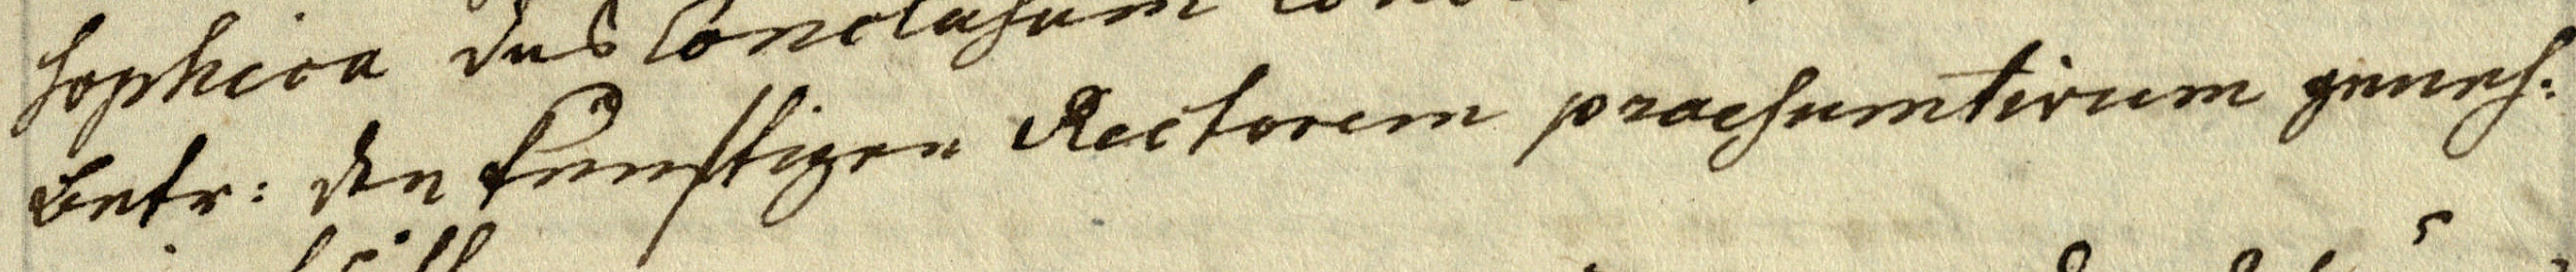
betr. den künftigen Rectorem praesumtivum geneh¬
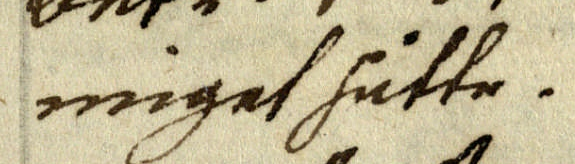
miget hätte.
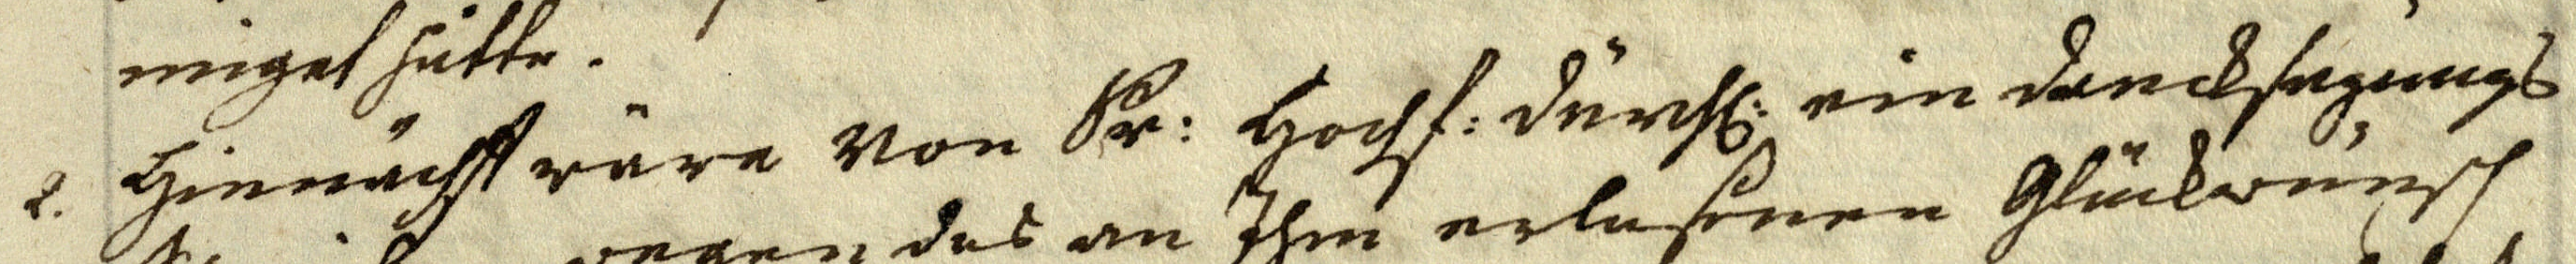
2. Hienächst wäre von Sr Hochs. Durchl ein Dancksagungs¬
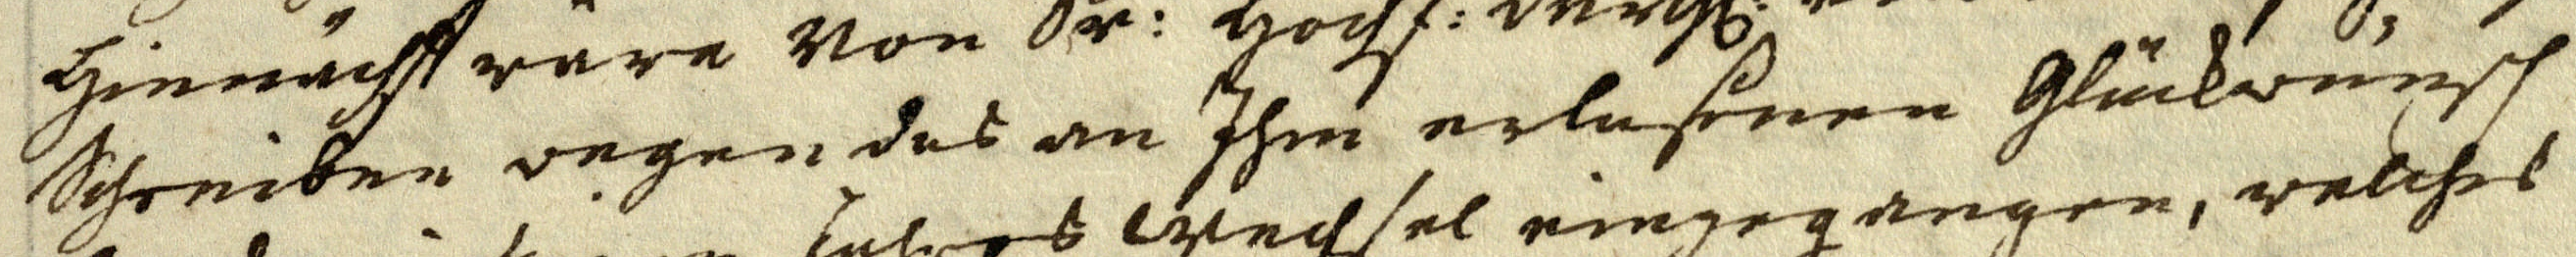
Schreiben wegen des an Ihm erlaßenen Glückwunsch
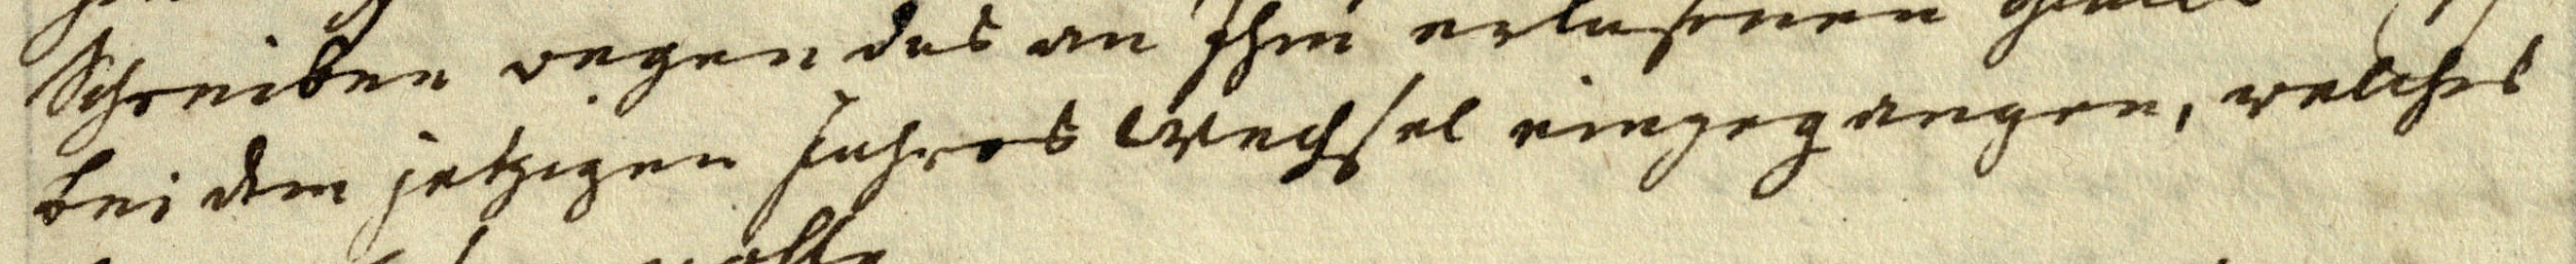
bei dem jetzigen Jahreswechsel eingegangen, welches
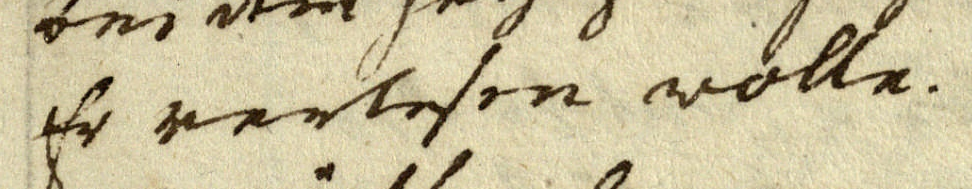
Er verlesen wolle.
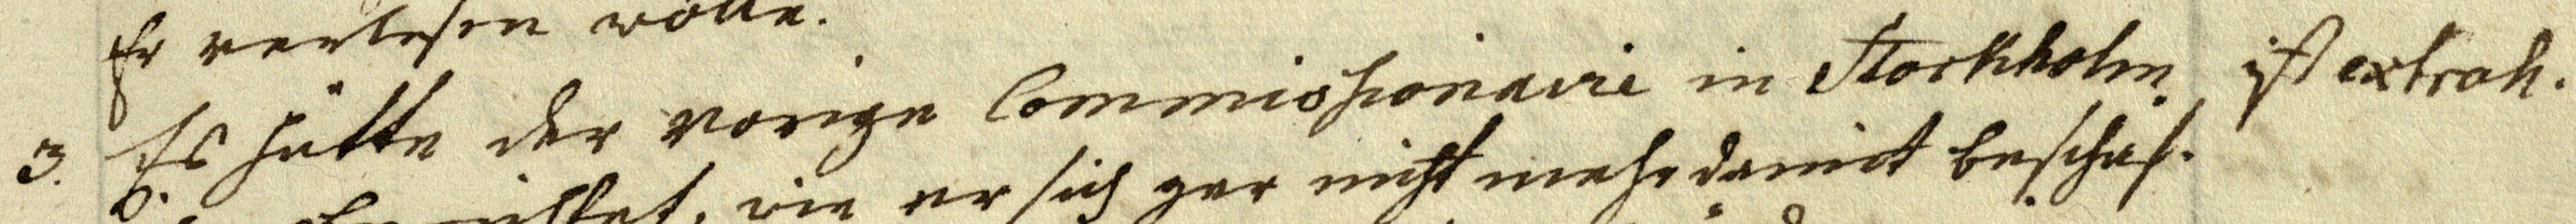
3. Es hätte der vorige Commissionaire in Stockholm
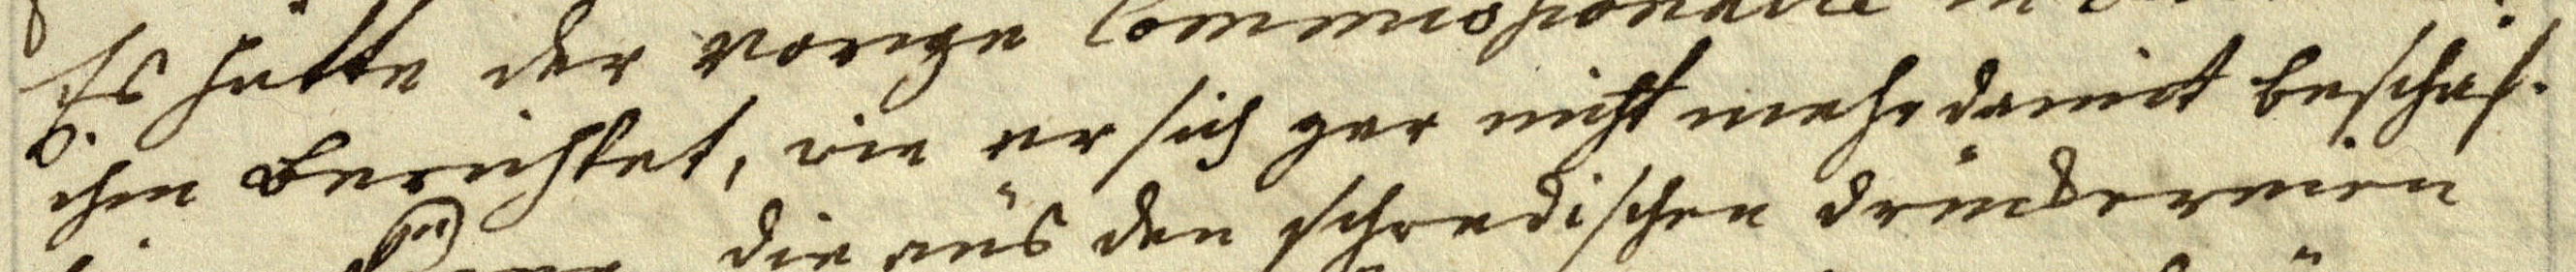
ihm berichtet, wie er sich gar nicht mehr damit beschäf¬
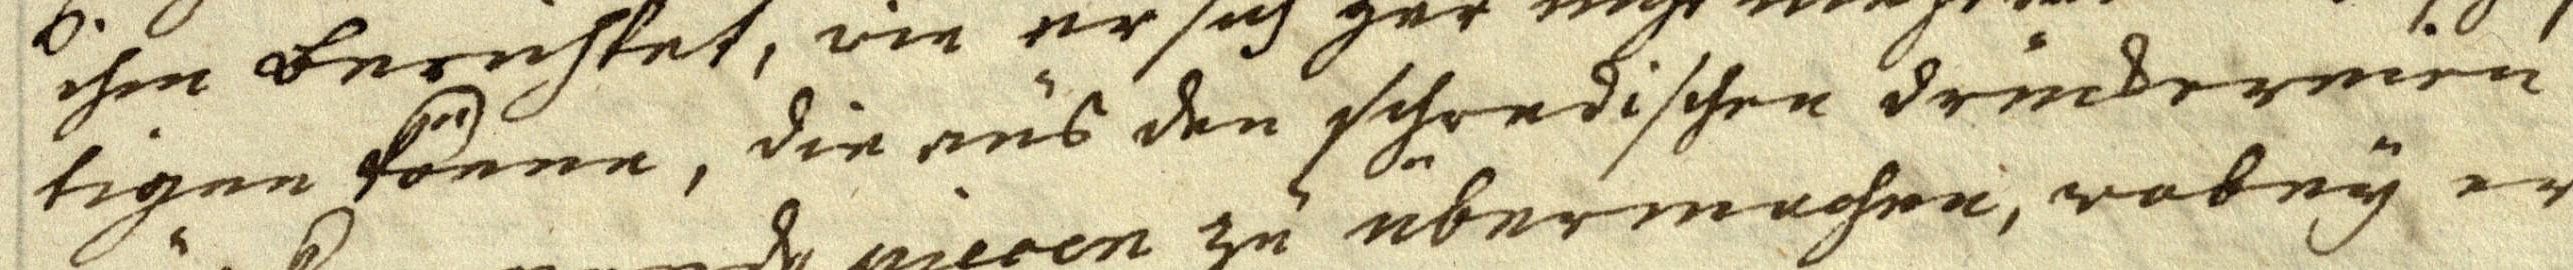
tigen könne, die aus den schwedischen Druckereien
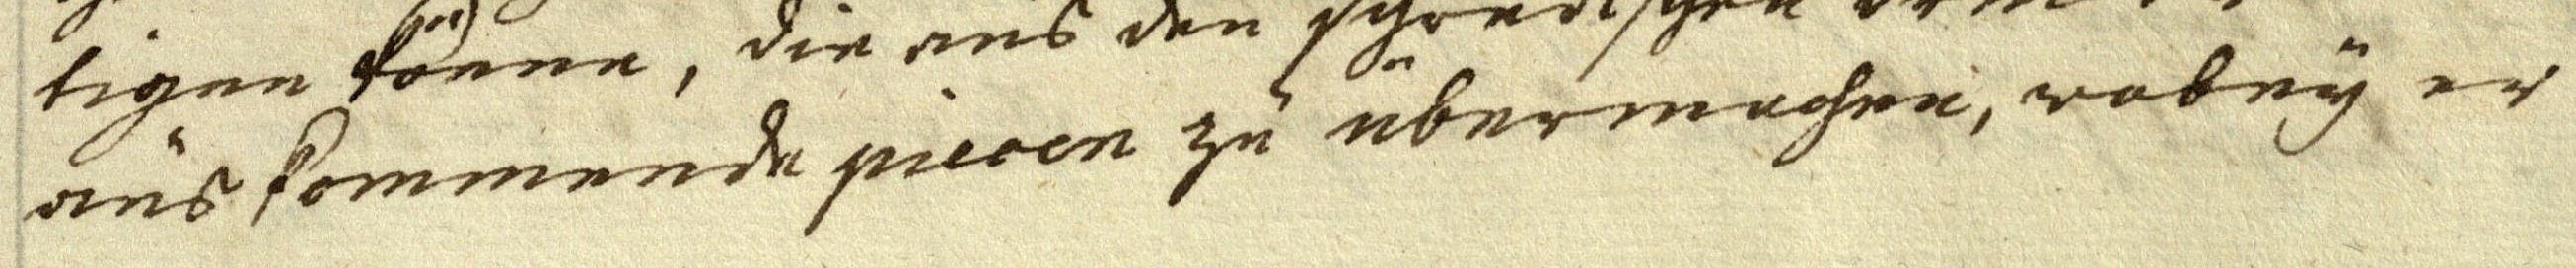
auskommende piecen zu übermachen, wobeÿ er
